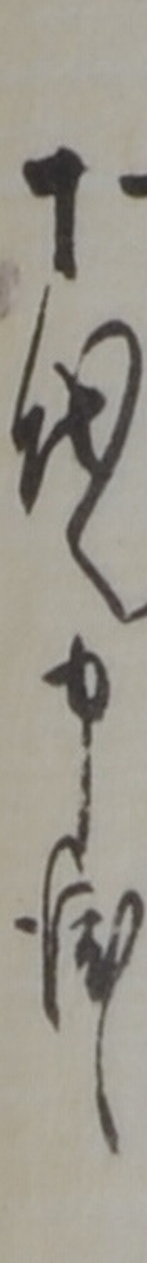丁代へ申渡候
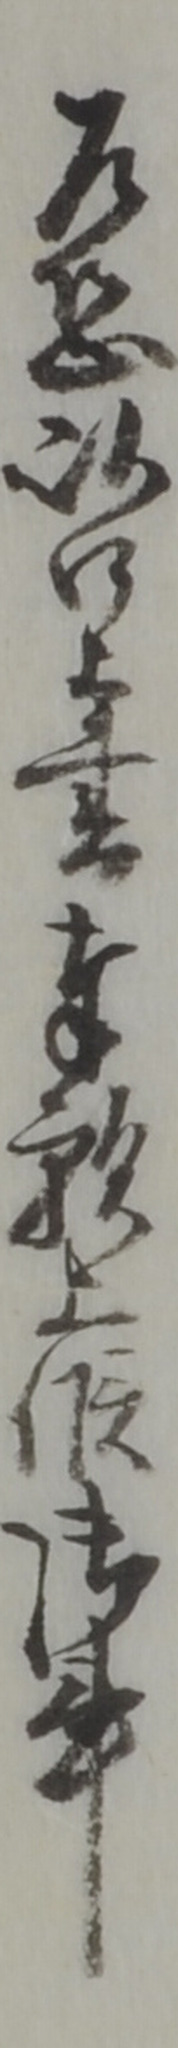乍恐以口上書奉願上候御事
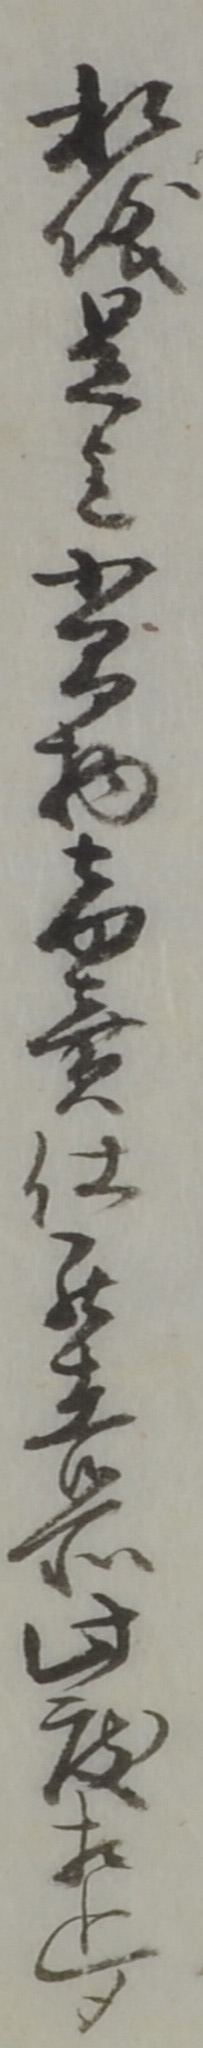私儀是迄小間物商売仕罷在候所此度相止メ
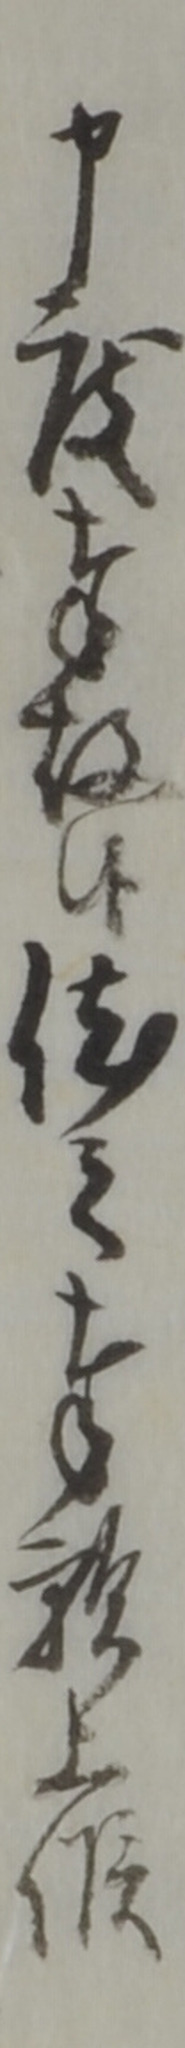申度奉存候依之奉願上候
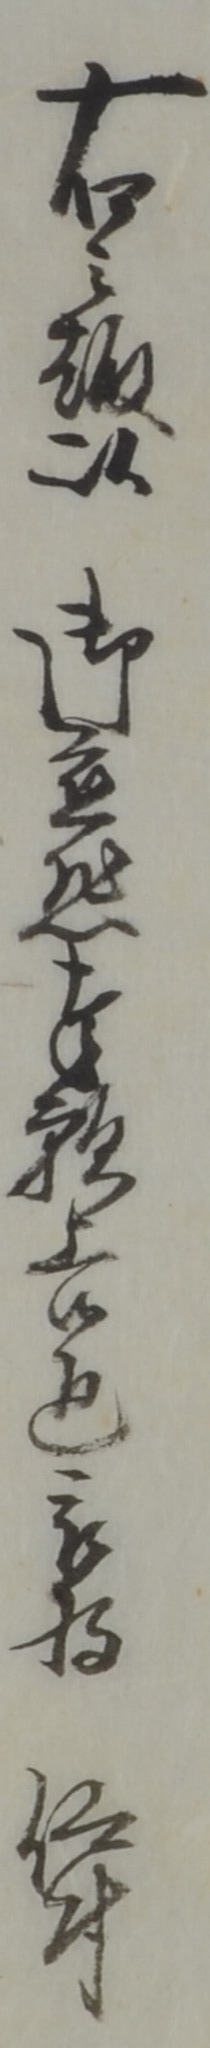右之趣以御慈悲奉願上候通被為仰付
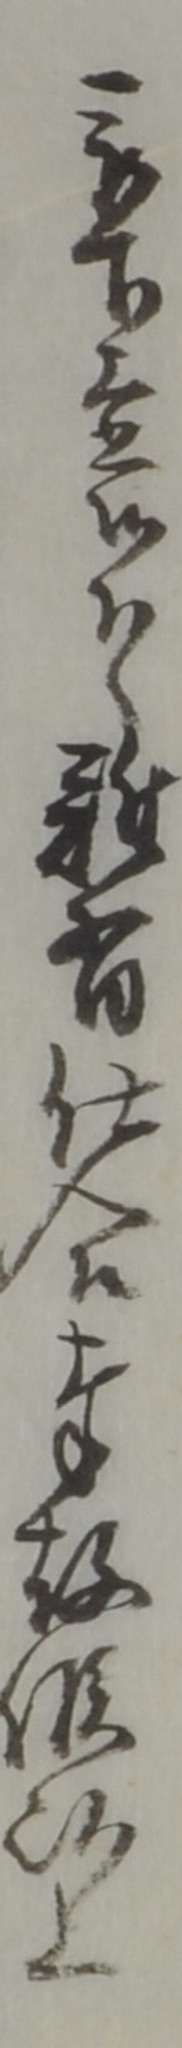被下置候ハヽ難有仕合奉存候以上
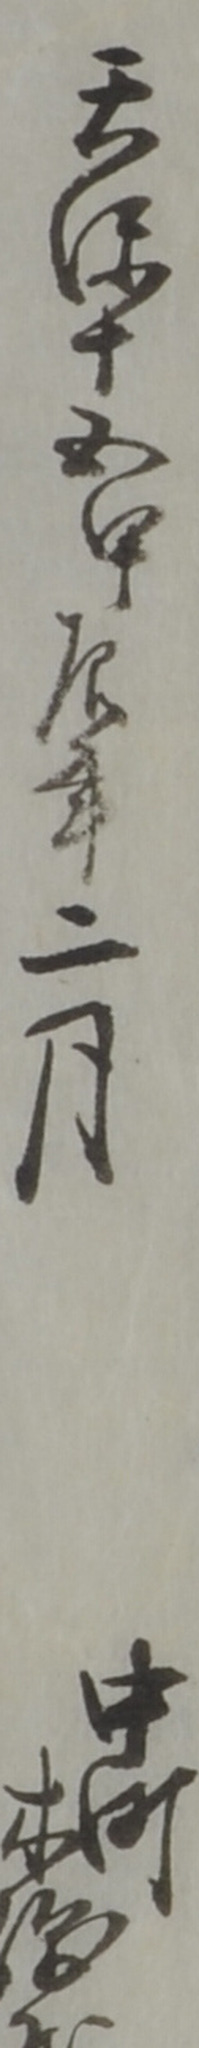天保十五甲辰年二月木綿屋
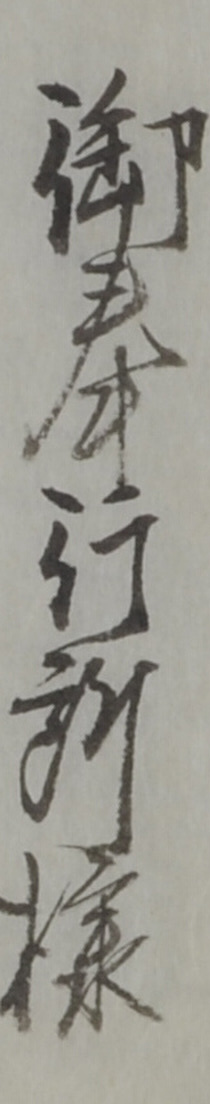御奉行所様
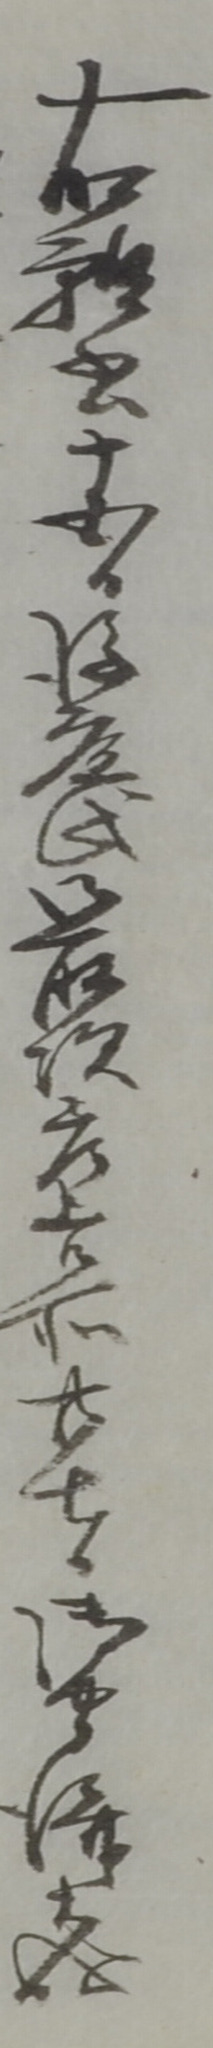右願書十五日後藤氏御取次差上候所廿七日御聞済相成
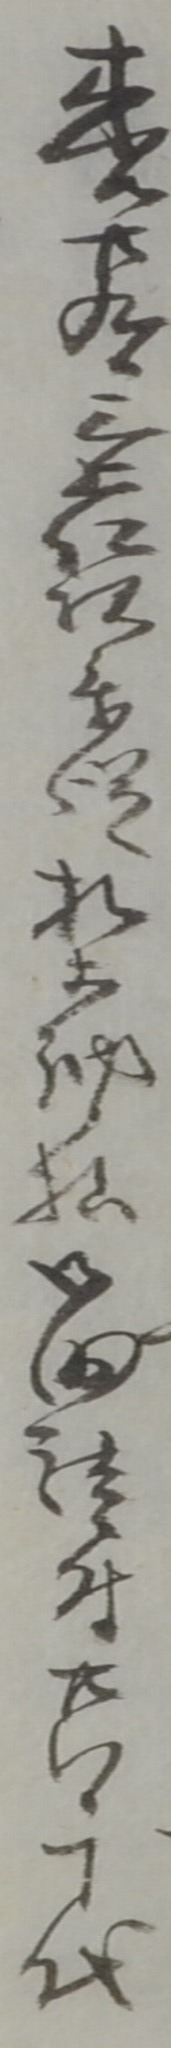来ル廿九日三上仁次兵衛様札相納候様御沙汰ニ付廿八日丁代
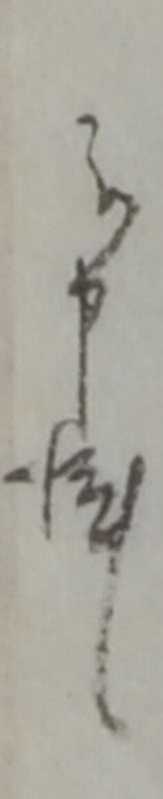江申渡候

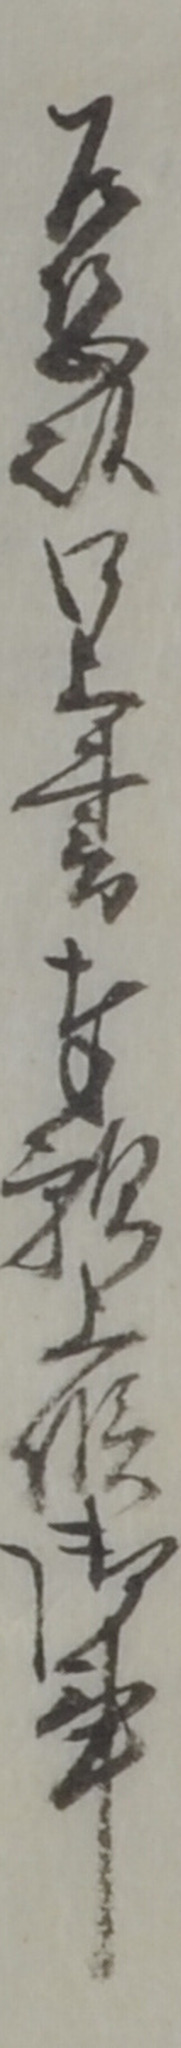乍恐以口上書奉願上候御事
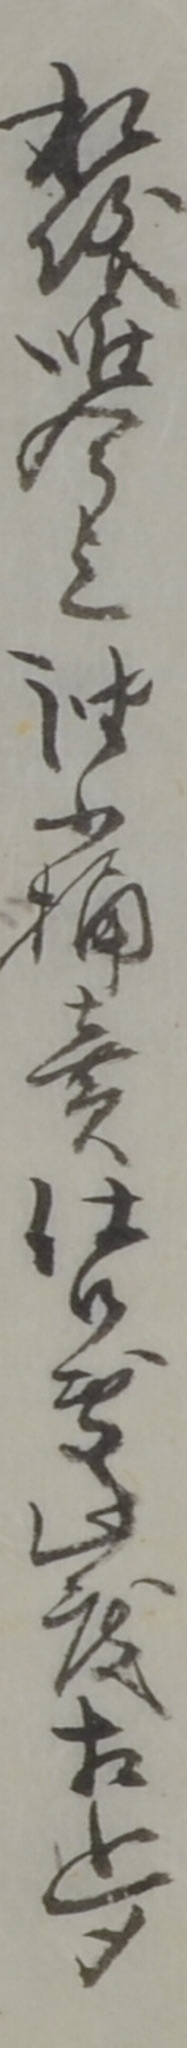私儀唯今迄油小桶売仕候處此度相止メ
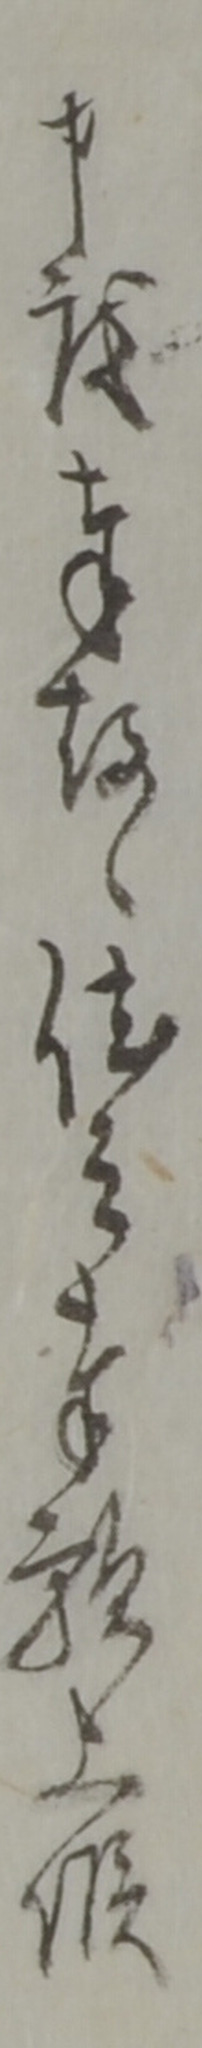申度奉存候依之奉願上候
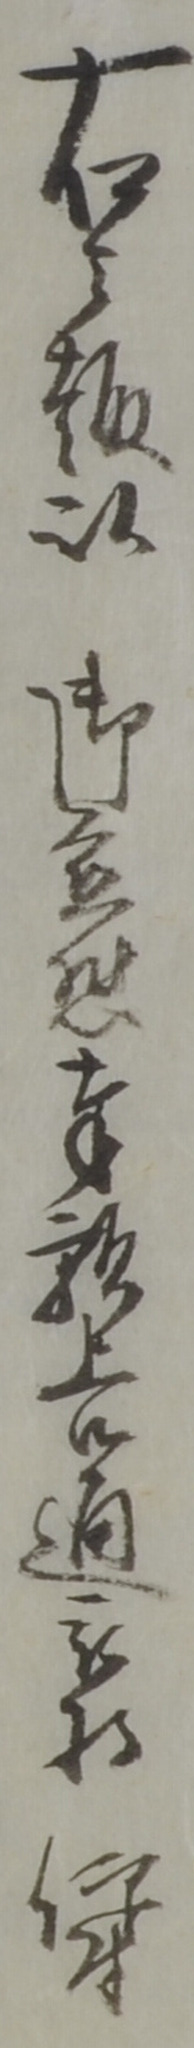右之趣以御慈悲奉願上候通被為仰付
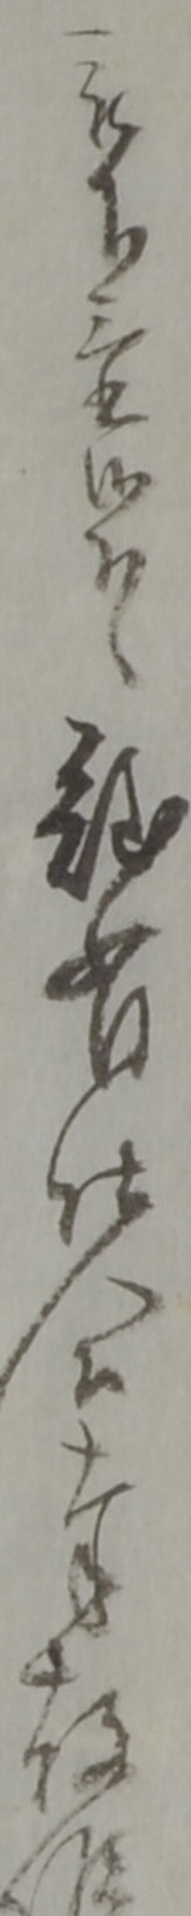被下置候ハヽ難有仕合奉存候以上
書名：諸願書控簿
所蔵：伊那市立高遠町図書館・合同会社AMANE
